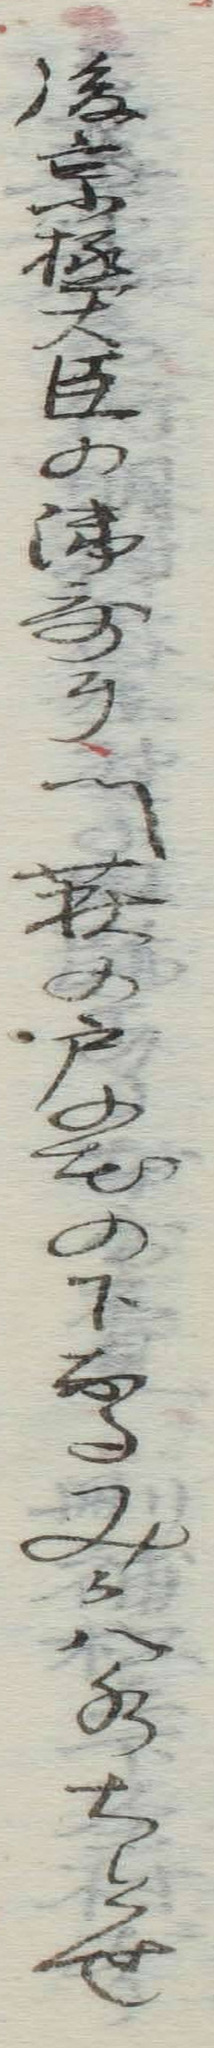後京極大臣の御歌に、〽萩の戸の花の下なるみかは水ちとせ
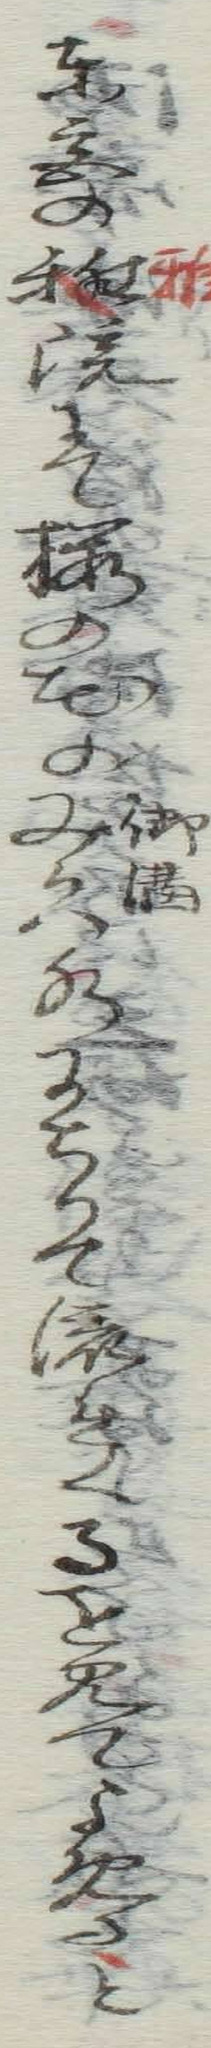東宮の雅院にて桜の花のみかは水にちりて流れくるを見てよめる、と
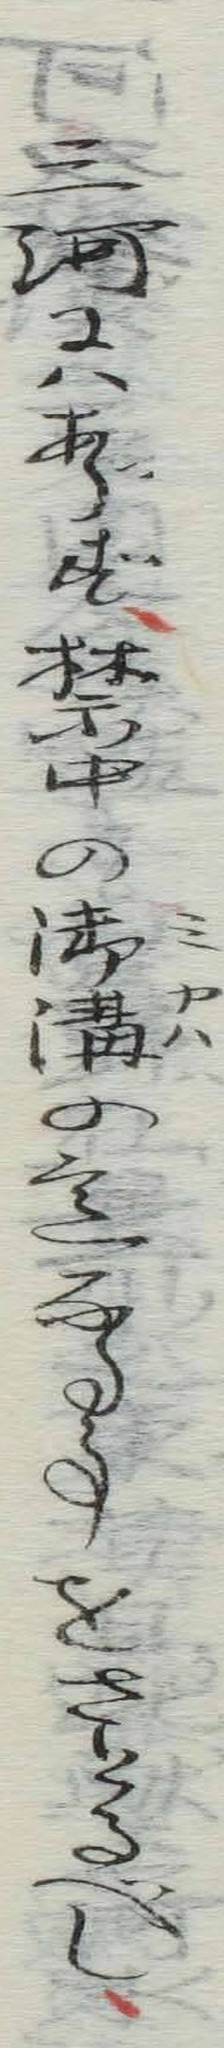三河にはあらず、禁中の御溝の意なる事をさとるべし、
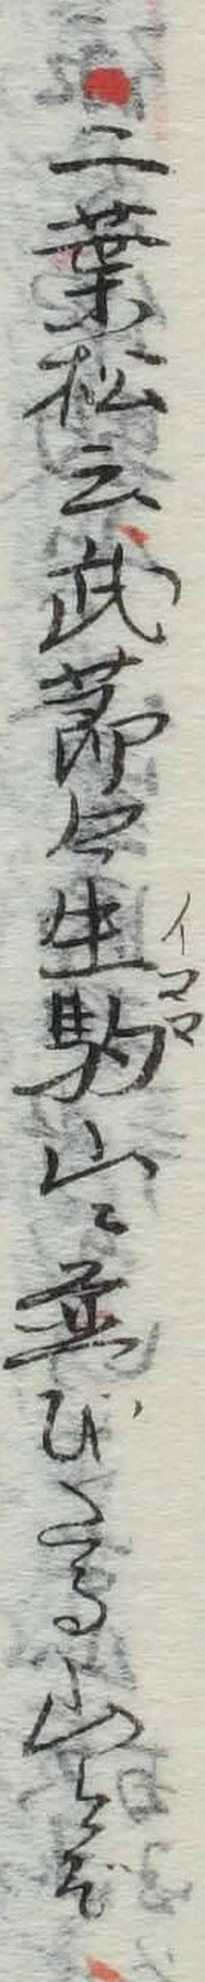●二葉松云、武節郷生駒山ニ並びたる山とぞ、
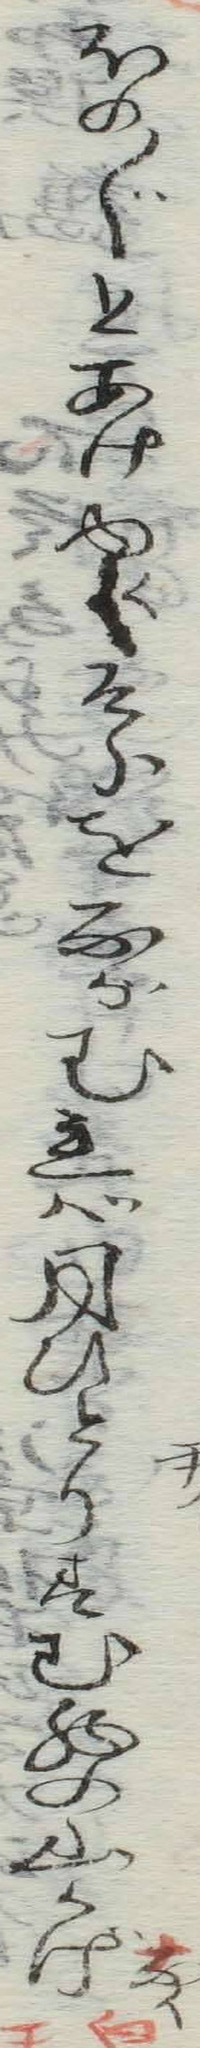ほの〴〵とあけゆくそらをながむれば月ひとりすむ西の山かげ白モ
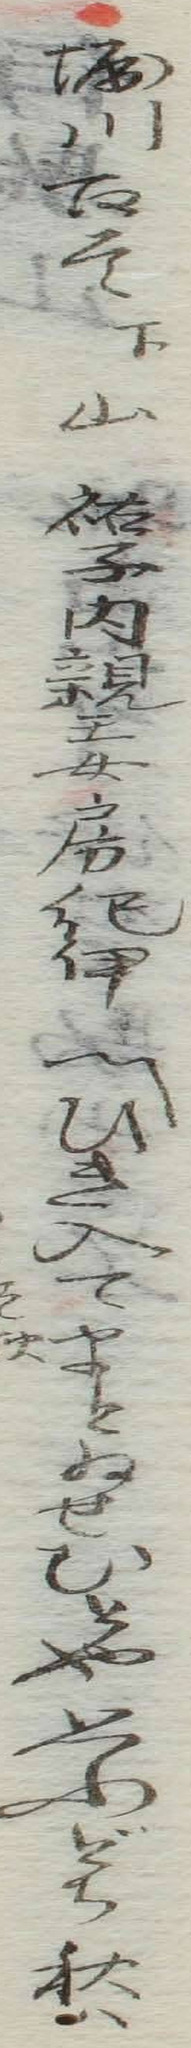●堀川百首下山祐子内親王女房紀伊〽ひき入てまとゐせむとや思ふどち秋は
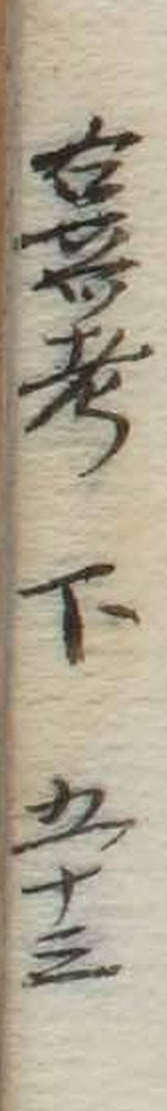古歌考下五十三

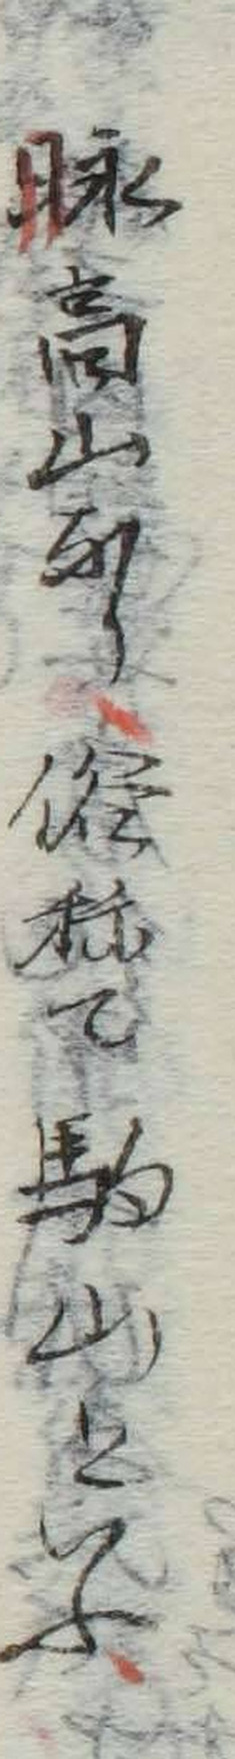脈高山なり、俗称て駒山といふ、
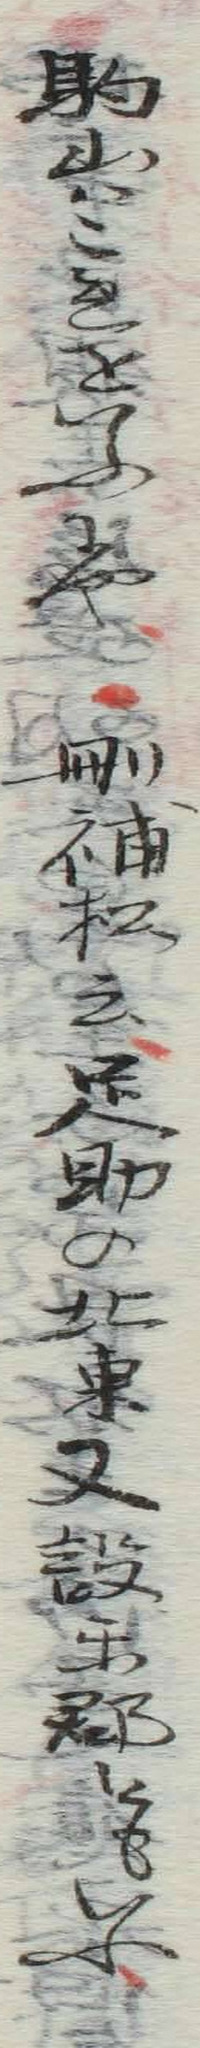駒山はこれをいふにや、●刪補松云、足助の北東又設楽郡ともいふ、
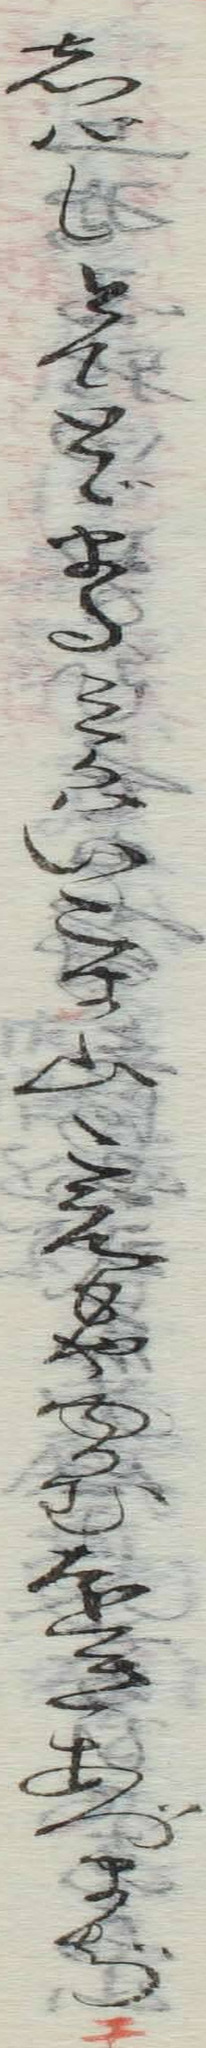しばしとてとゞまるみかはいこま山こえもやゆかむ遠きあづまぢモ
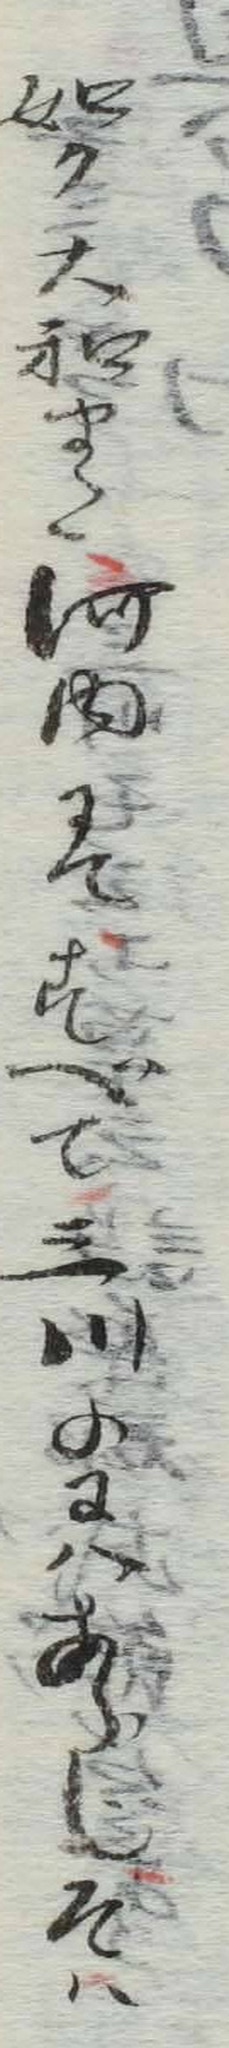如ク大和また、河内にて、すべて三川のにはあらじ、そは
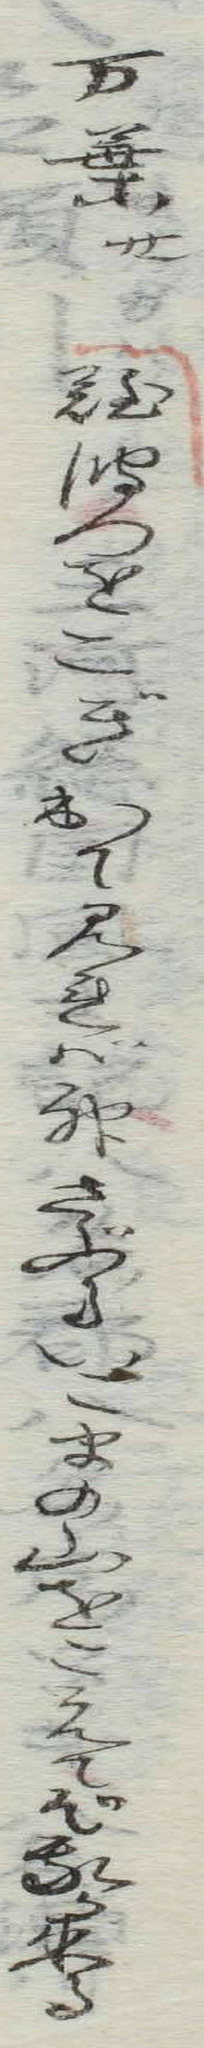万葉廿〽難波つをこぎ出て見れば神さぶるいこまの山をこえてぞ我か来る
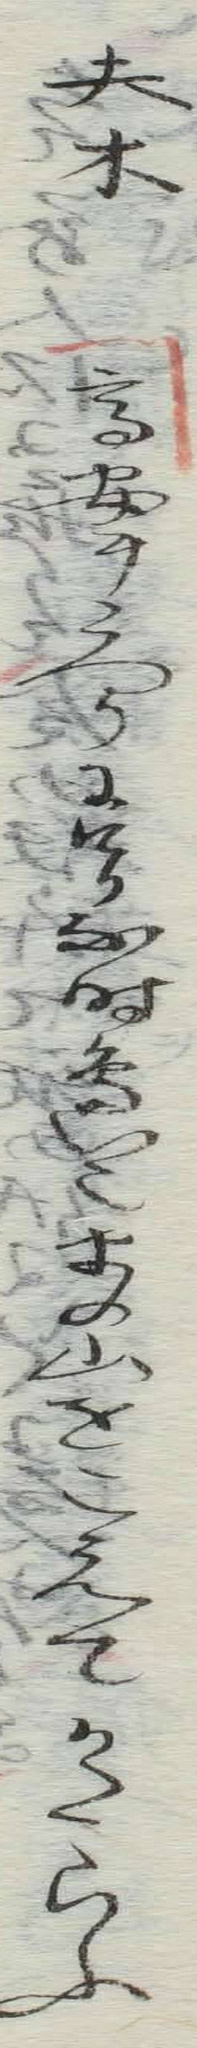夫木〽高安にうつりにけりな時鳥いこまの山をこえてかたらふ
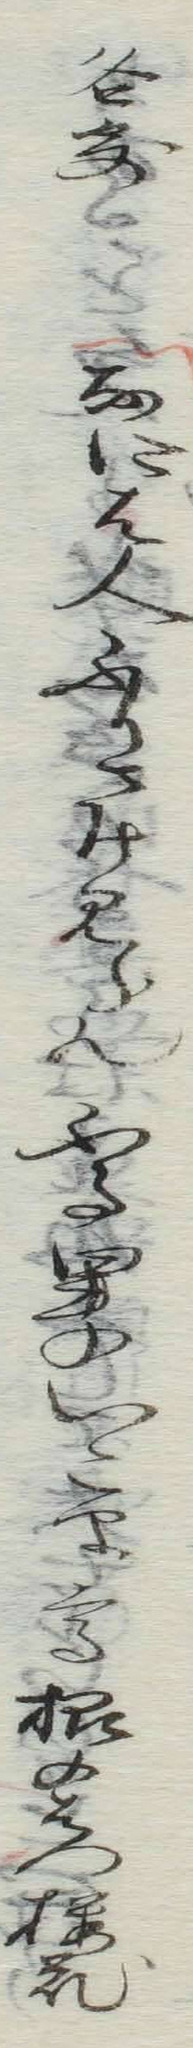名寄〽なには人ふりさけ見らんふる里のいこま高根のはつ桜花
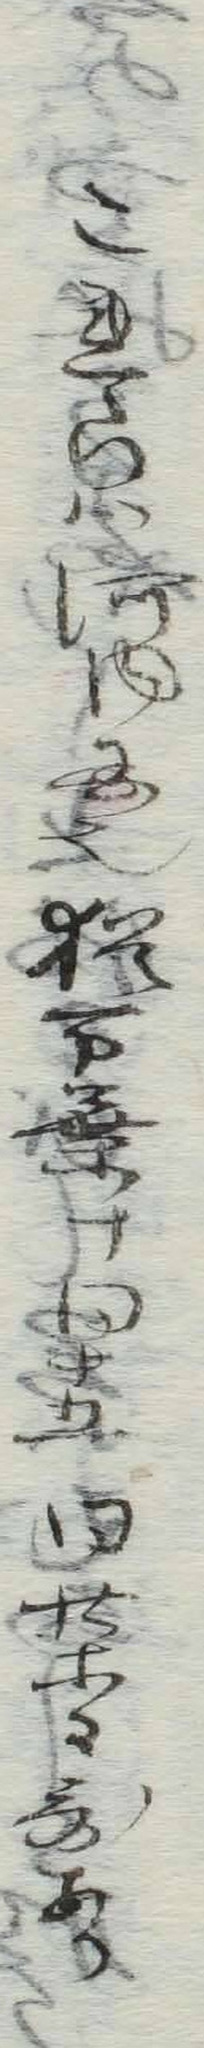これらは河内国也猶万葉十同十五同廿等に歌あり
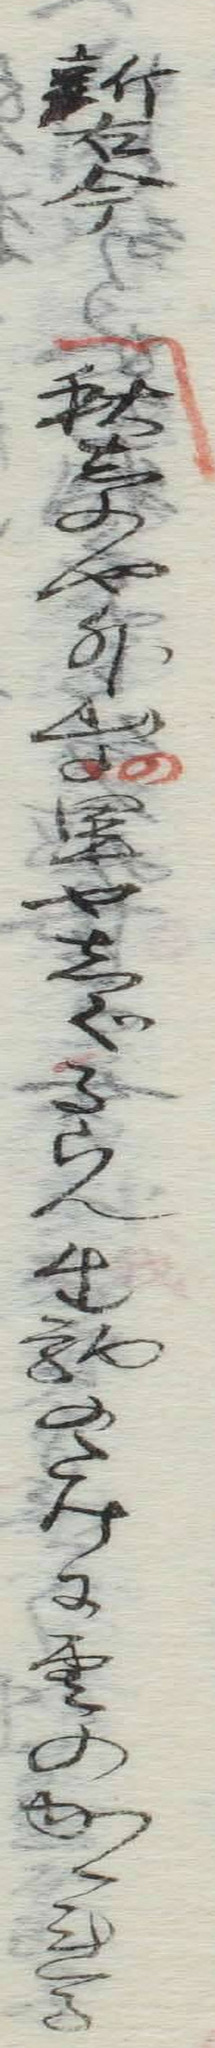新古今〽秋しのや外山の里やしぐるらん生駒のたけに雲のかゝれる
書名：三河国古跡考
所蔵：国文学研究資料館
